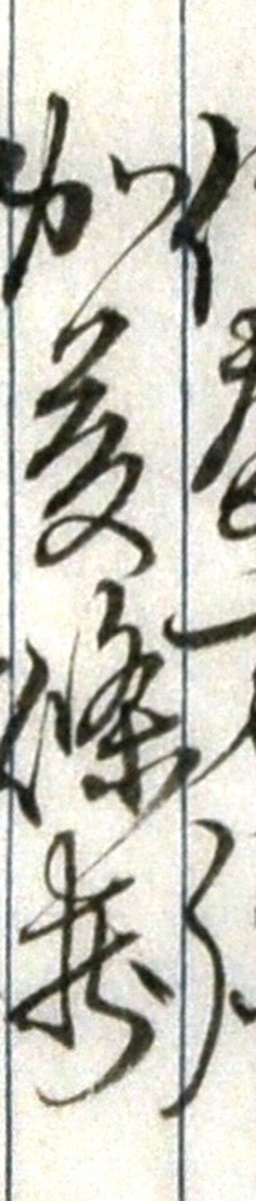加藤條蔵
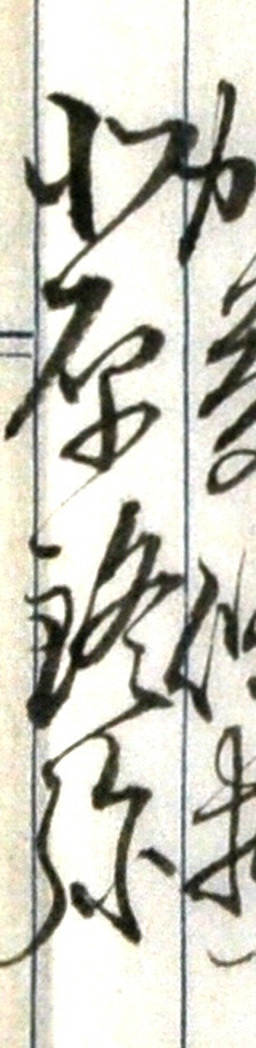北原啓弥

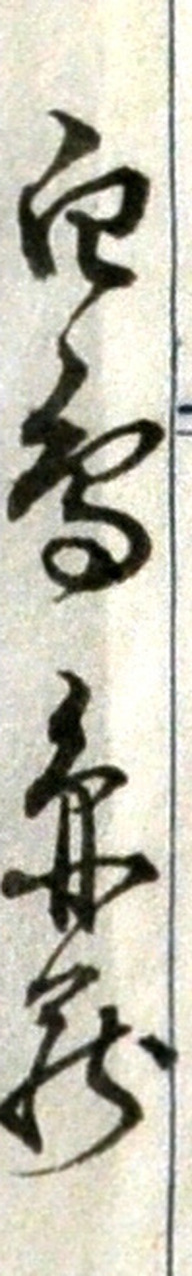白鳥圓蔵
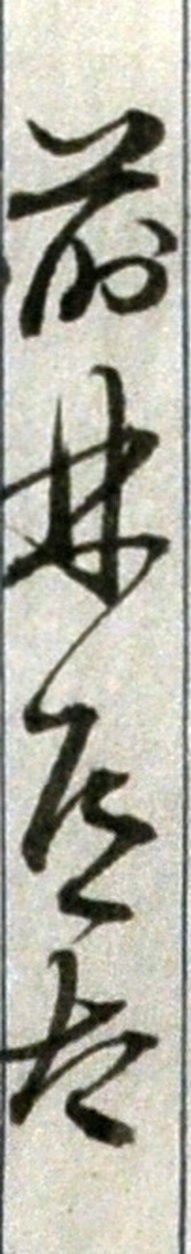前林道太
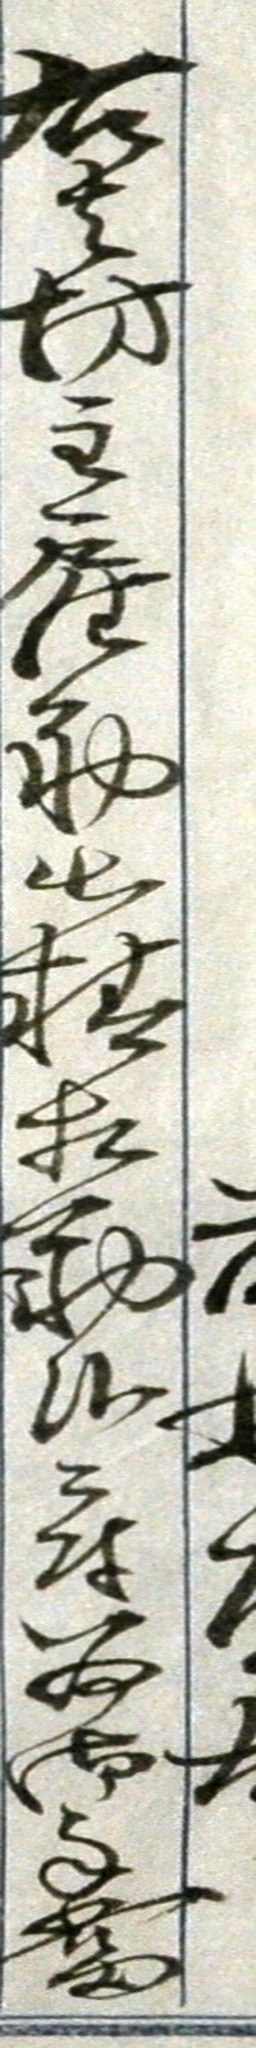右者坊主雇筋出精相勤候ニ付為御手当
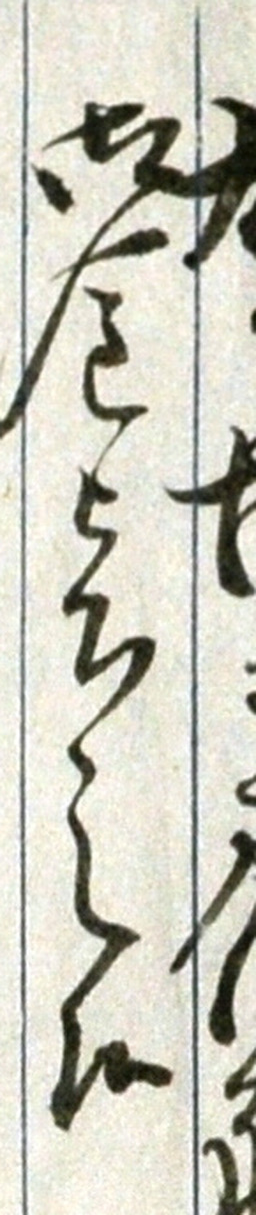御金被下之候
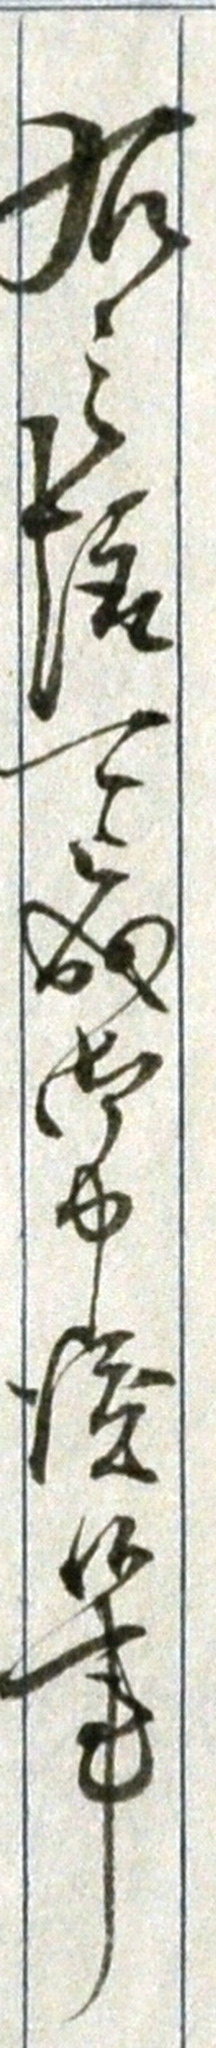右之趣可被成御申渡候事
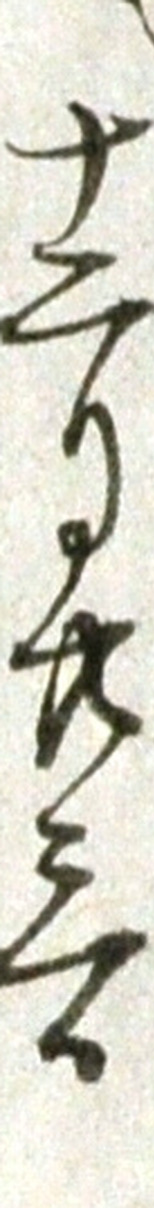十二月廿三日
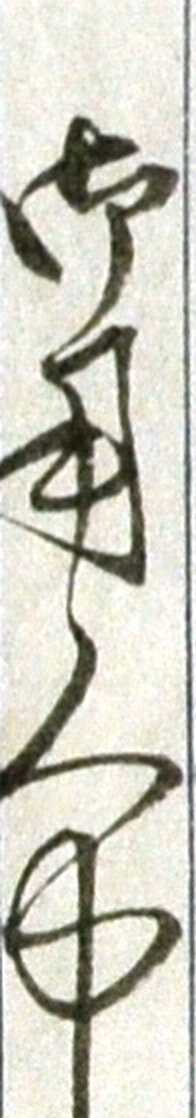御用人中
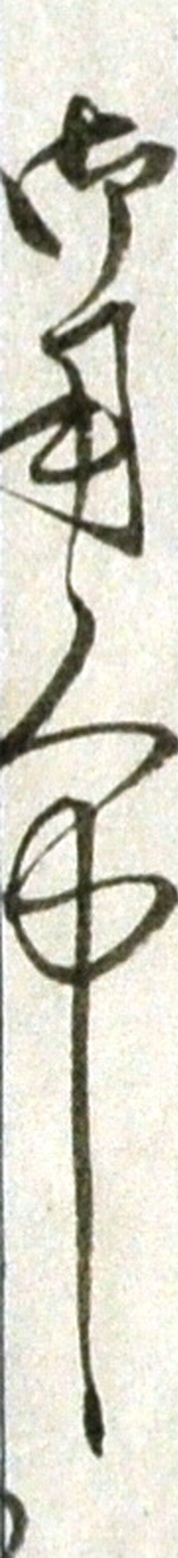御用人中
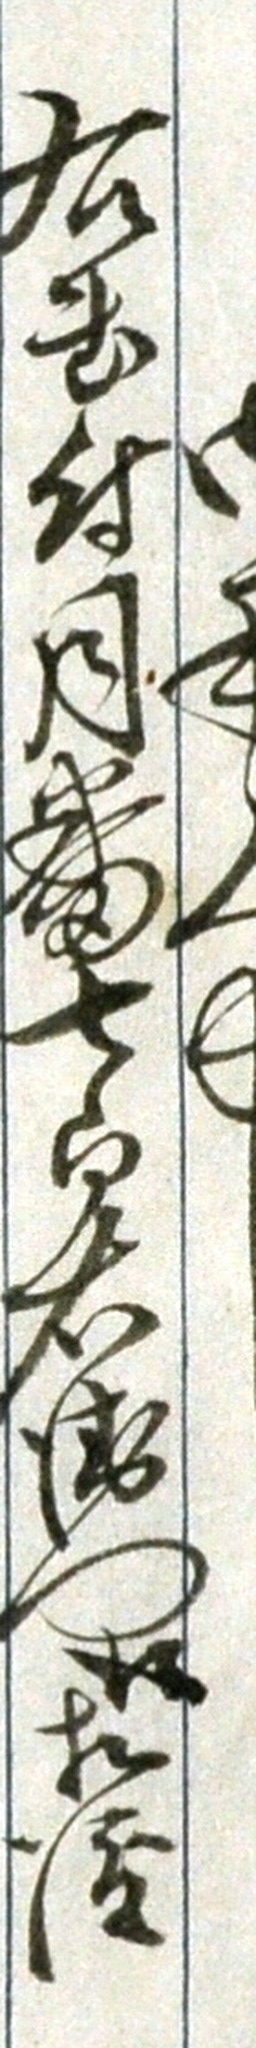右書付月番七郎右衛門江相渡
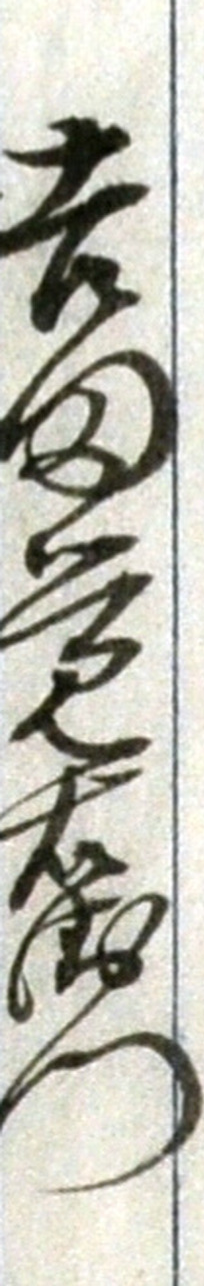吉田覚右衛門
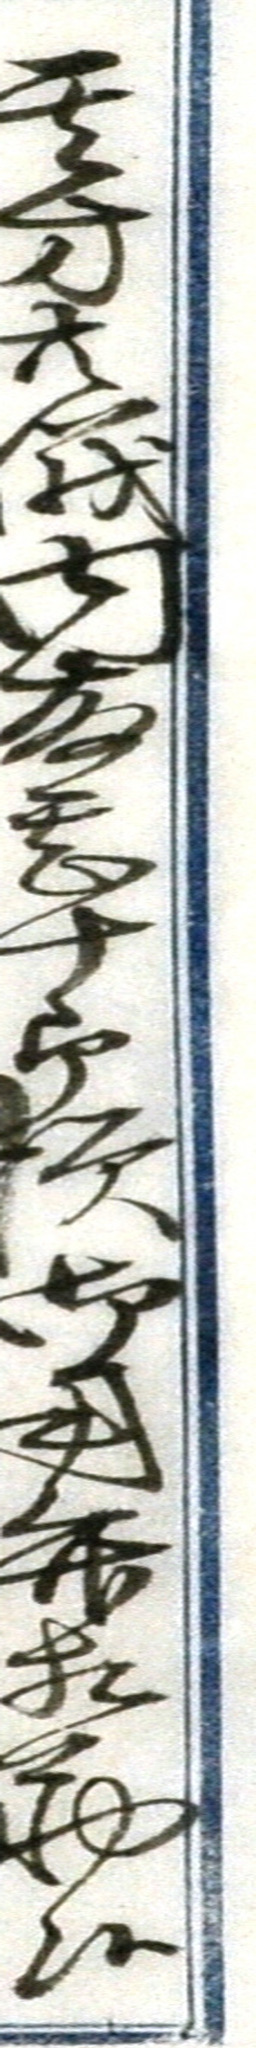其方共儀内藤甚十郎様御用弁相勤候
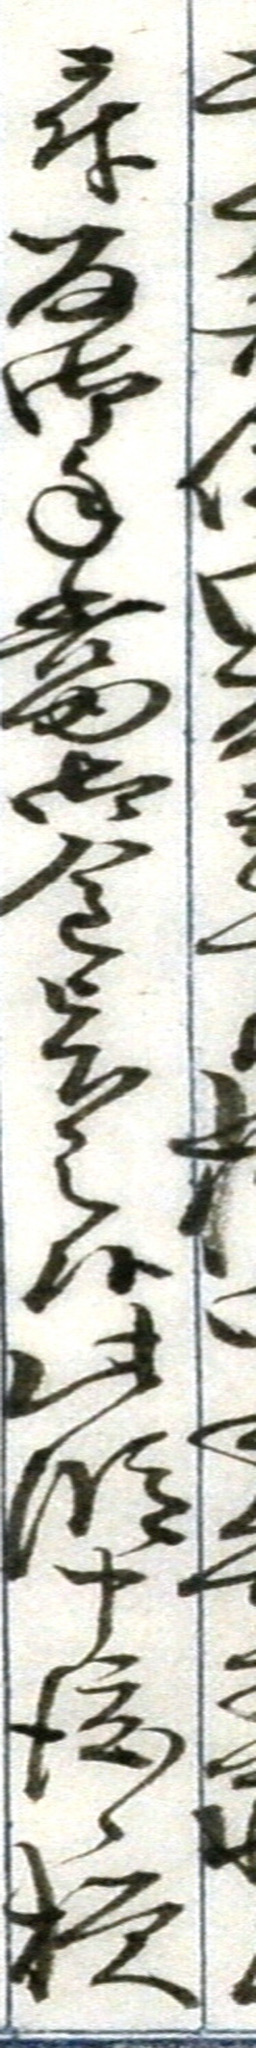ニ付為御手当御金被下之候此段申渡候様
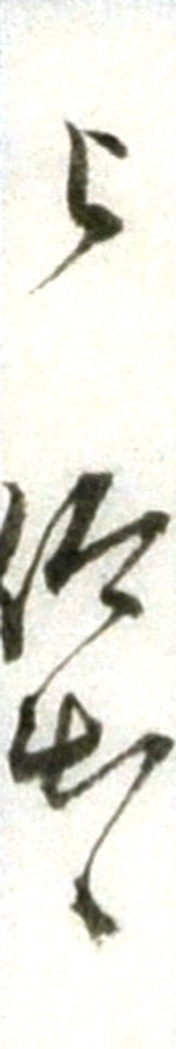被仰出候
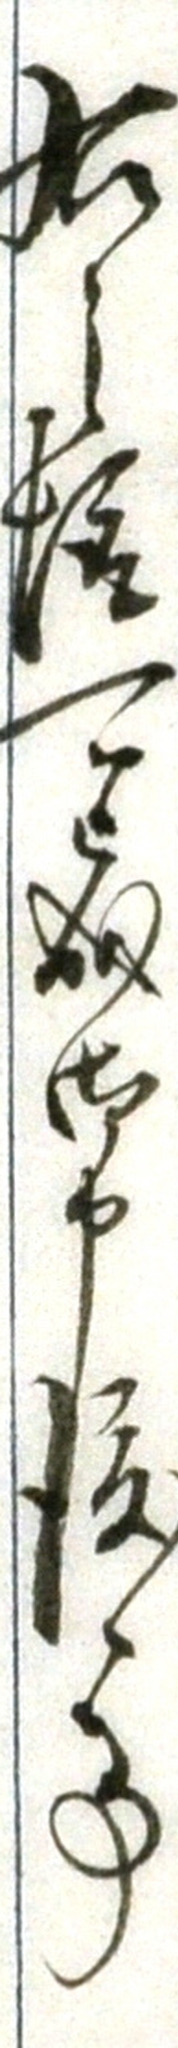右之趣可被成御申渡候事
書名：上方ヨリ御帰府之後江戸勤并江戸在番中之者江被下・控
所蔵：伊那市立高遠町図書館・合同会社AMANE
